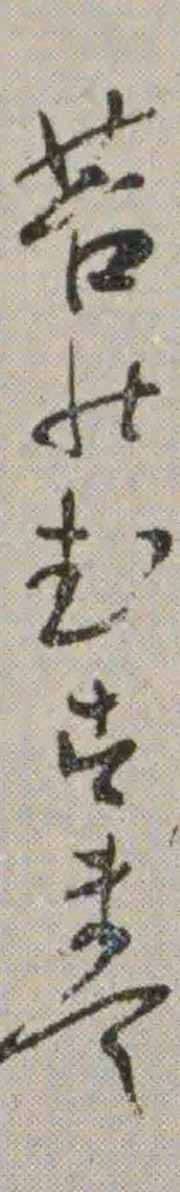苔のむすまて
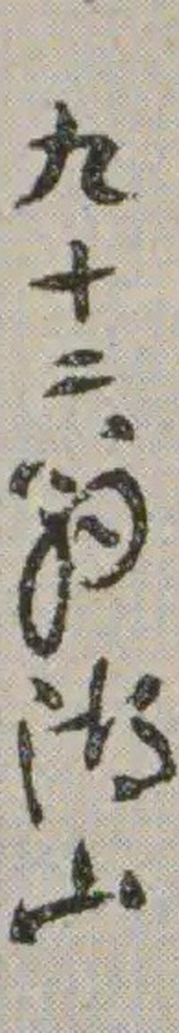九十二翁湖山

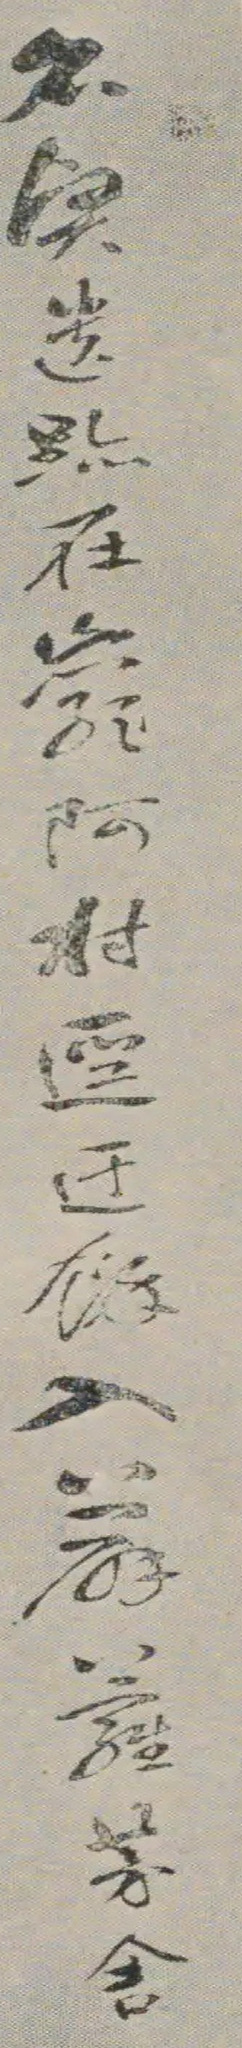名賢遺跡在巌阿村逕迂餘入翁蘿茅舎
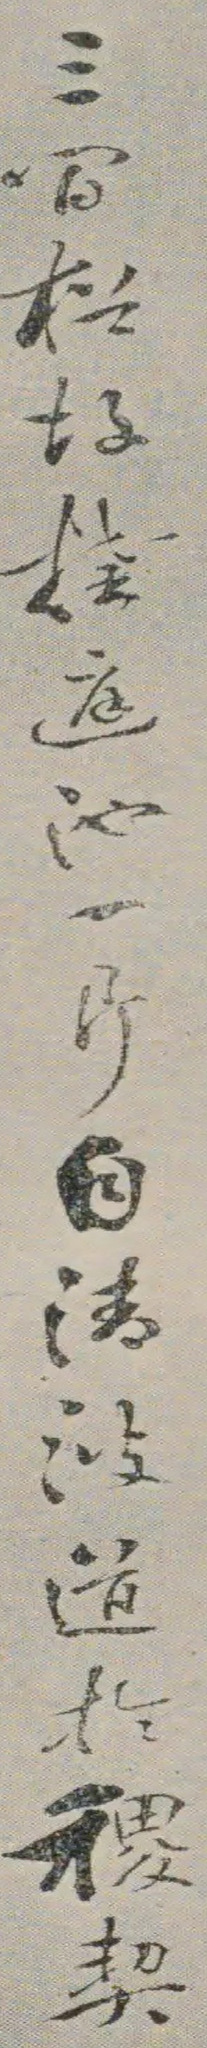三間猶故搆庭池一断自清波道於稷契
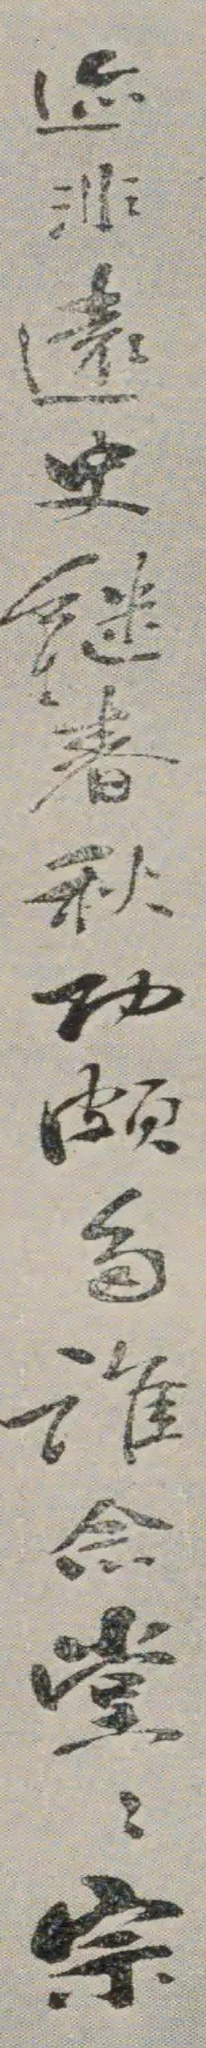迹非遠史継春秋功頗多誰念堂々宗
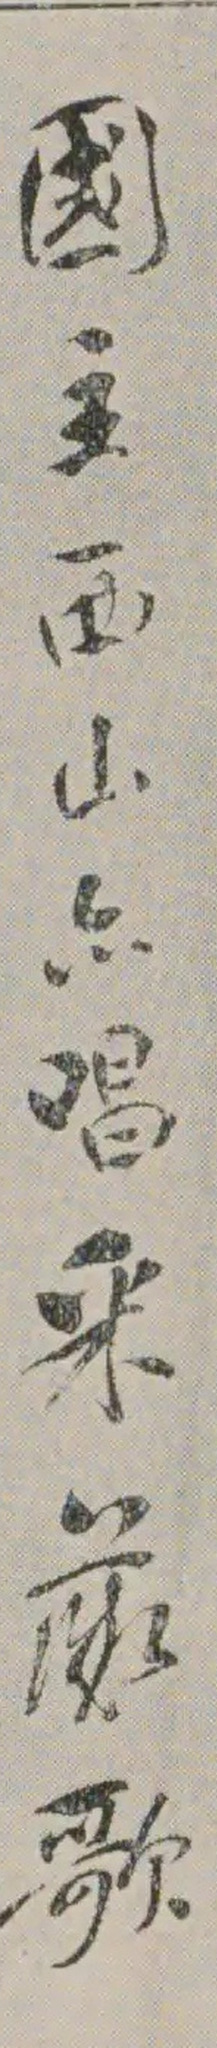國主西山亦唱釆薇歌
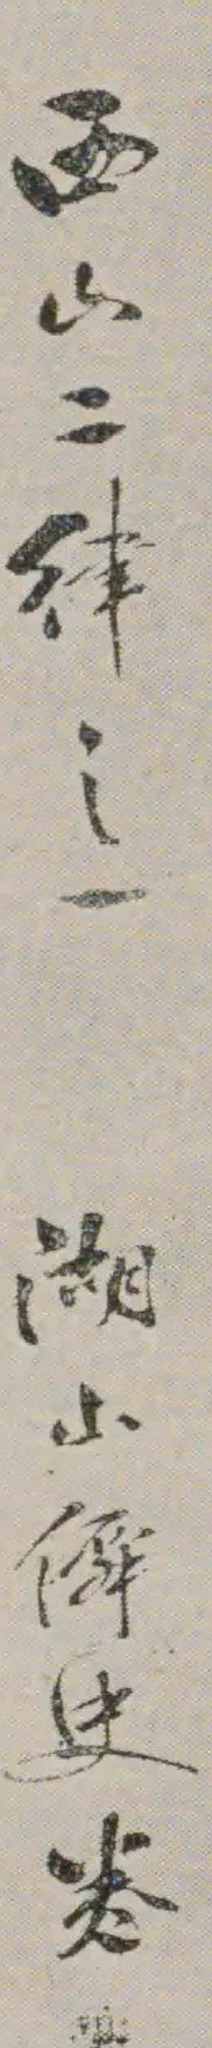西山二律之一湖山僲史巻
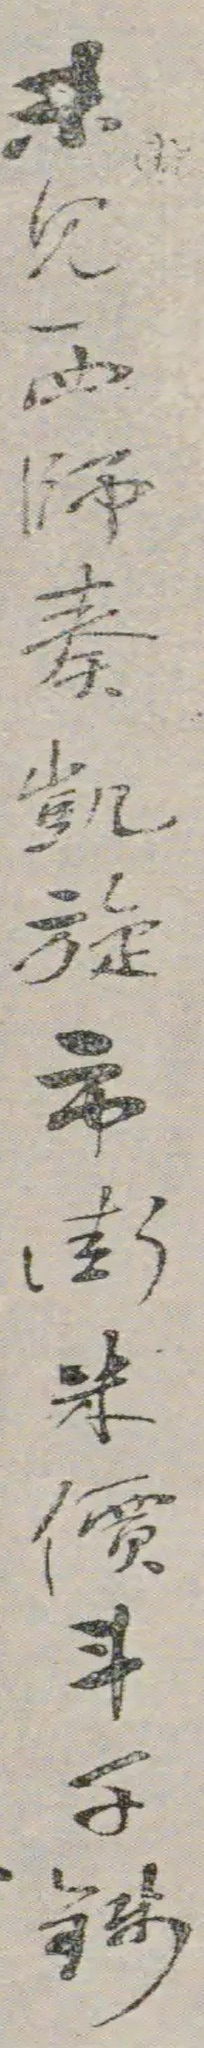未見西師奏凱旋市街米價斗千銭
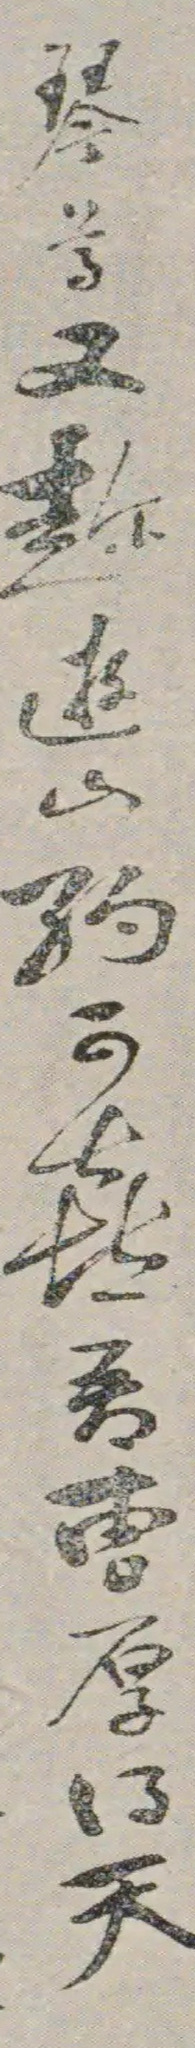琴尊又趁遊山約可㐂吾曹厚得天

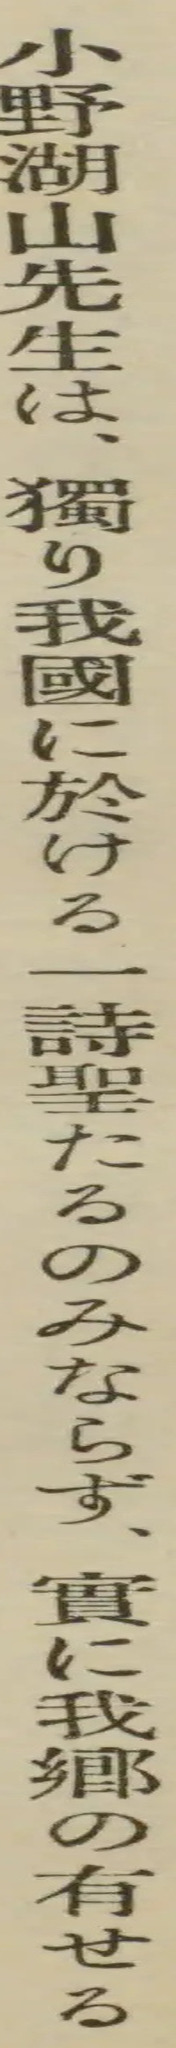小野湖山先生は、独り我国に於ける一詩聖たるのみならず、実に我郷の有せる
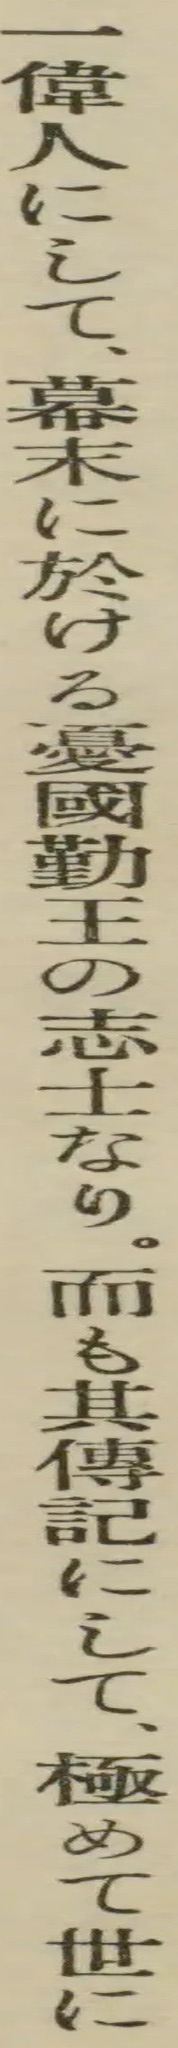一偉人にして、幕末に於ける憂国勤王の志士なり、而も其伝記にして、極めて世に
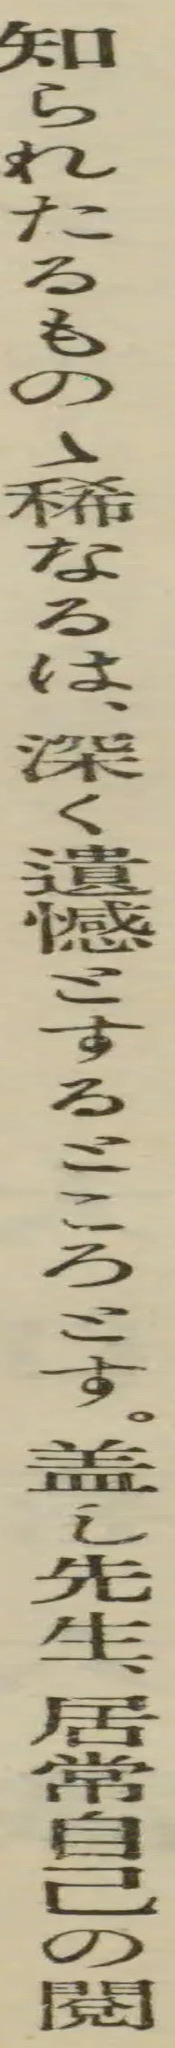知られたるものゝ稀なるは、深く遺憾とするところとす。蓋し先生、居常自己の閲
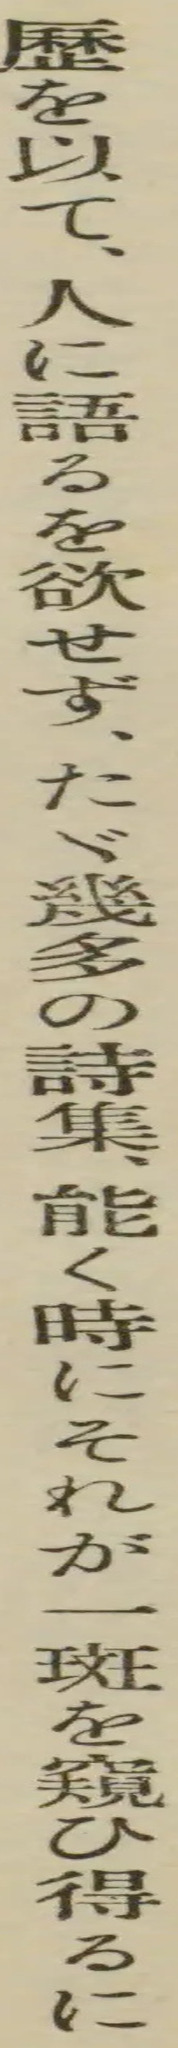歴を以て、人に語るを欲せず、たゞ幾多の詩集、能く時にそれが一斑を窺ひ得るに
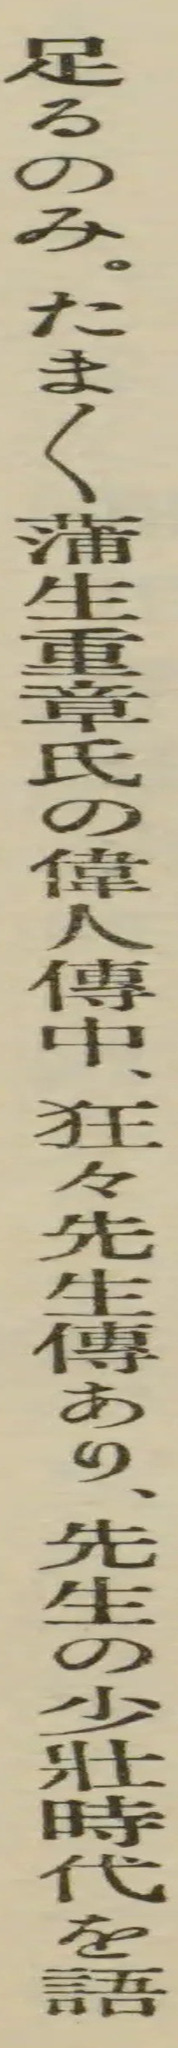足るのみ。たま〳〵蒲生重章氏の偉人伝中、狂々先生伝あり、先生の少壮時代を語
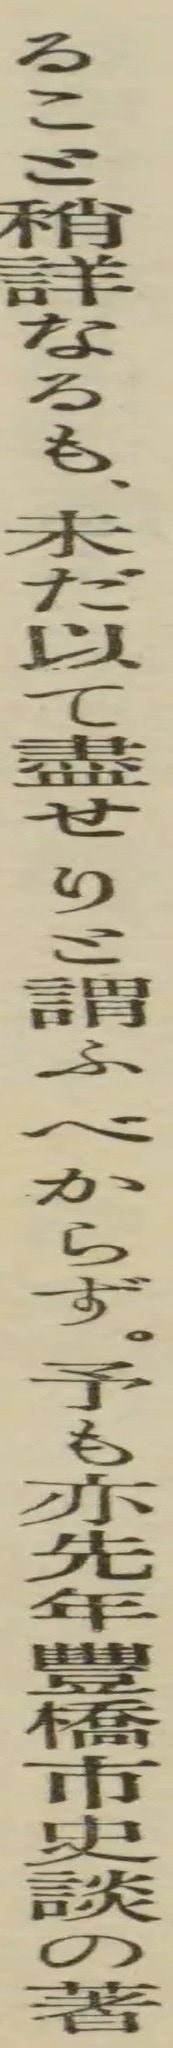ること稍詳なるも、未だ以て尽せりと謂ふべからず。予も亦先年豊橋市史談の著
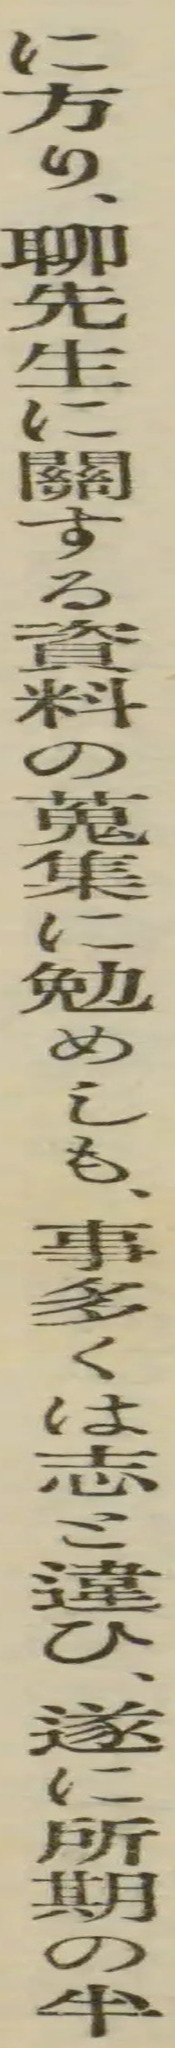に方り、聊先生に遺関する資料の蒐集に勉めしも、事多くは志と違ひ、遂に所期の半
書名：小野湖山翁小伝
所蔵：国立国会図書館 National Diet Library, JAPAN
